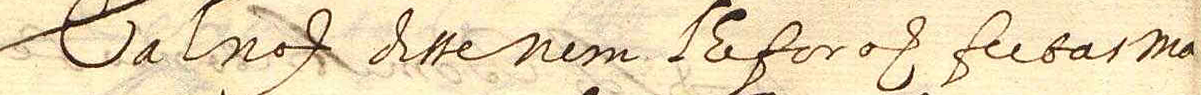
E al naõ disse nem lhe forão feitas ma
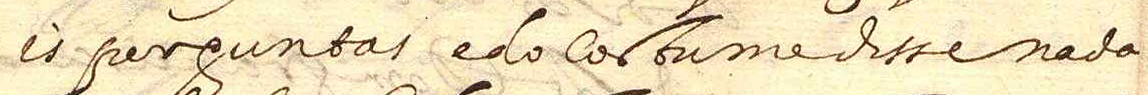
is perguntas e do costume disse nada
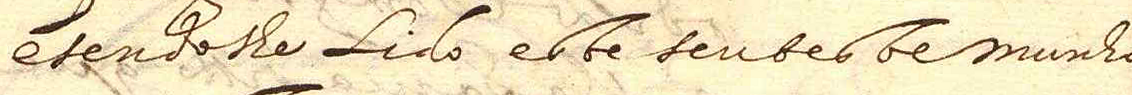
e sendolhe Lido este seu testemunho
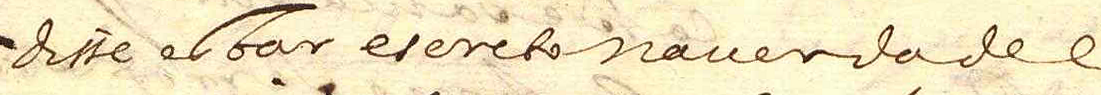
disse estar escrito na uerdade e
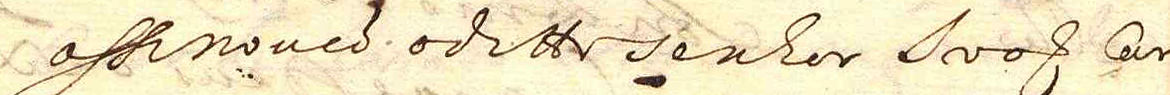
assinou cō o ditto senhor Ioaõ Car
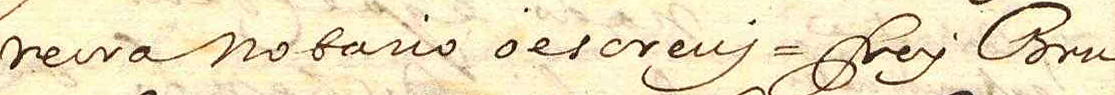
reira notario o escreuj = frey Bru
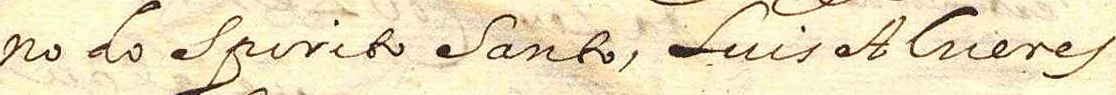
no do Spirito Santo, Luis Alueres
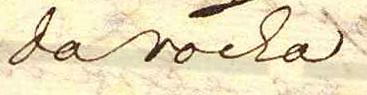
da rocha
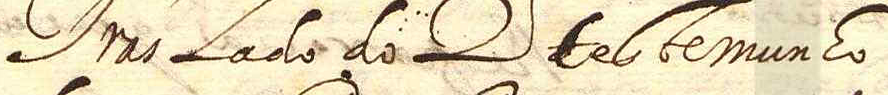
TrasLado do 2º testemunho
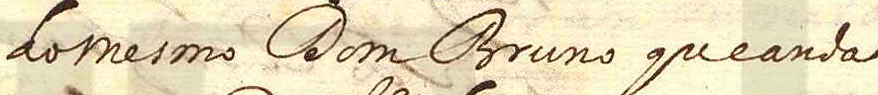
do mesmo Dom Bruno que anda
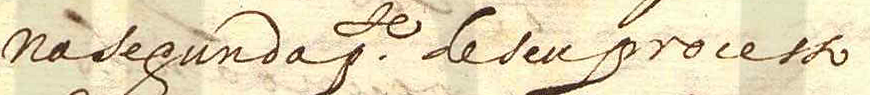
na segunda p.te de seu processo
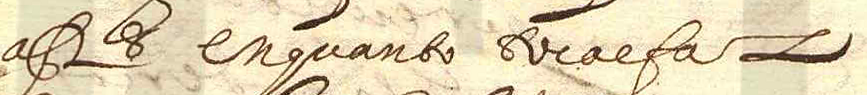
a fl 8 enquanto toca e faZ
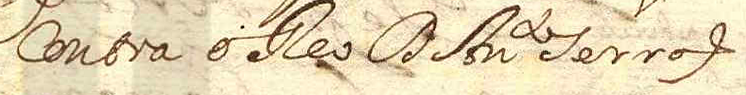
contra o Reo D Anto Serraõ
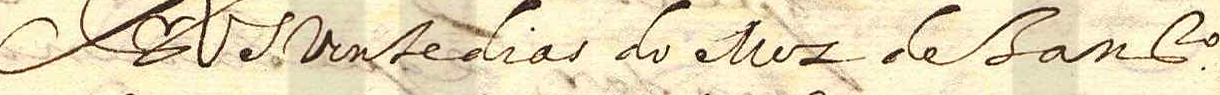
Aos vinte dias do Mez de Ianro.
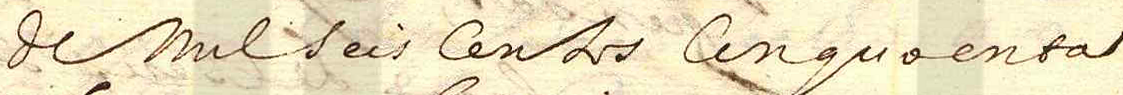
de mil seisCentos Cinquoenta
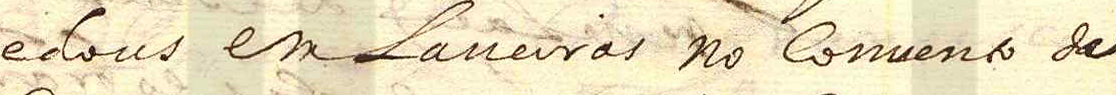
e dous em Laueiras no Conuento de
